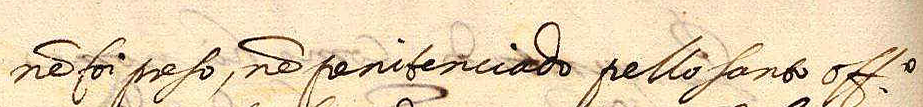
nē foi preso, nē penitenciado pello santo off.o
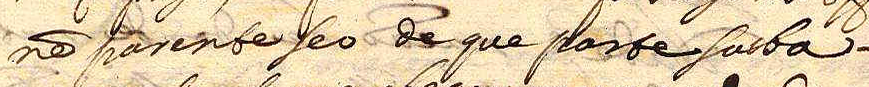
nē parente seo de que parte saiba
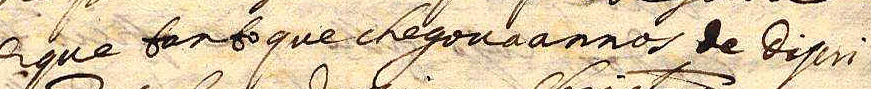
E que tanto que chegou a annos de discri
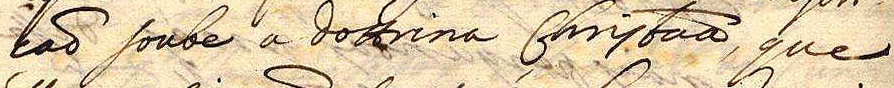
çaõ soube a doctrina Christaā, que
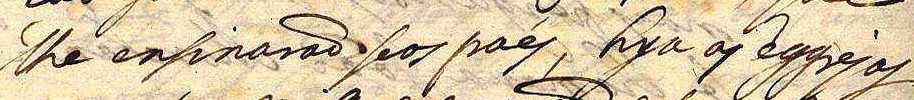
lhe ensinaraõ seos paes hya as eggrejas
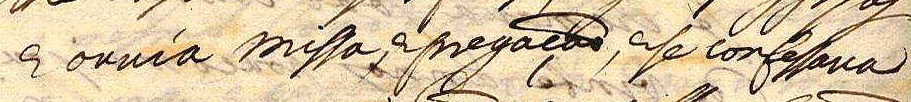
E ouuia missa, E pregaçaõ, E se confessaua
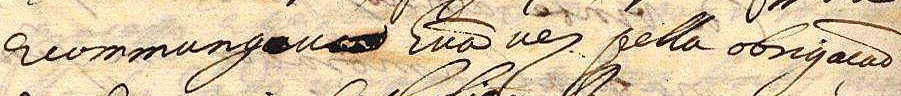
E commungaua huā uez pella obrigação
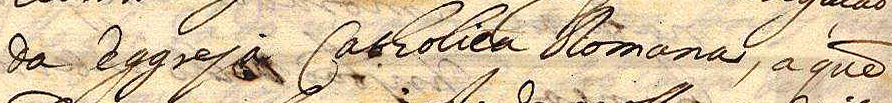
da eggreja Catholica Romana, a que
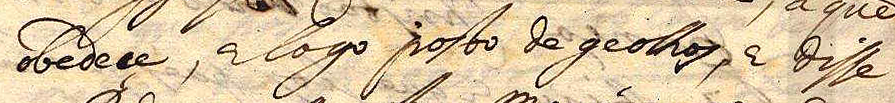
obedece, E logo posto de geolhos, E disse
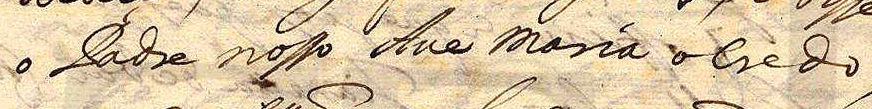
o Padre nosso Aue Maria o credo
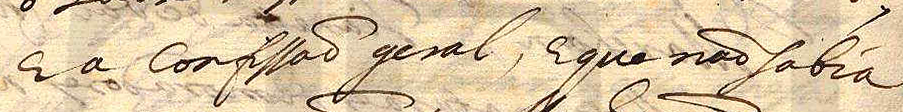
E a confissaõ geral, E que naõ sabia
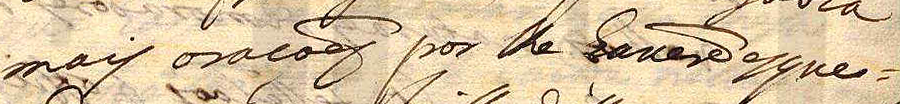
mais oraçoẽs por lhe hauerē esque
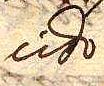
cido
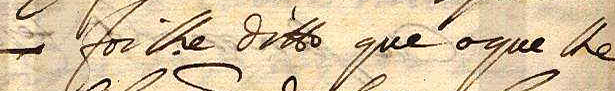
foi lhe ditto que o que lhe
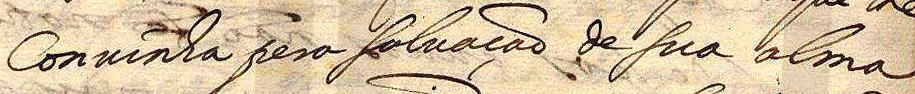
Conuinha pera saluação de sua alma
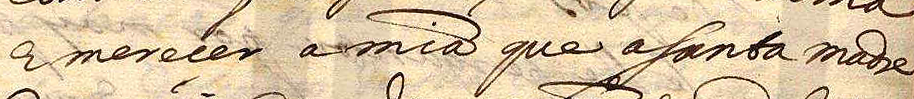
e merecer a mīa que a santa madre
